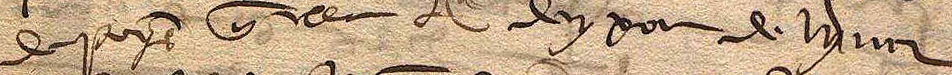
depoys q̄ ella ta deyxou de vyuer
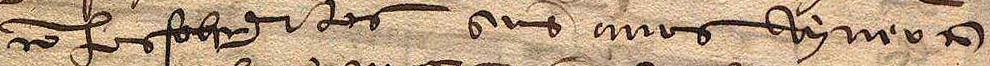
c̄o hos sobreditos seus amos vyueo cō
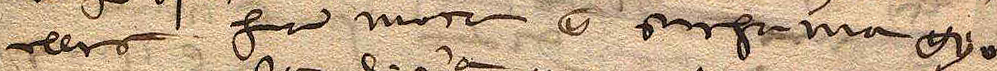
elles huā moça q̄ se chama gyo
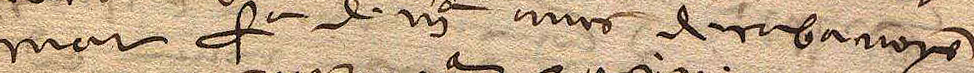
mar fa de ma anes de cabanoỹs
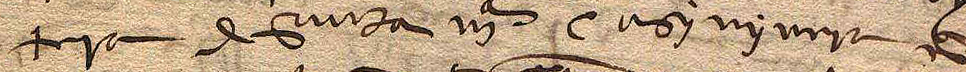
tera de santa ma e asy uyuera cō
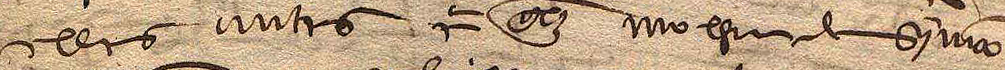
elles antes ca ḡlz molher de symão
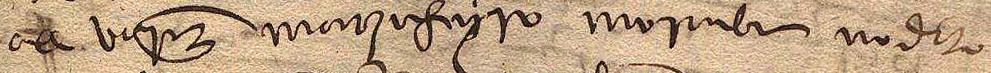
allvarez marjnheyro morador no dito
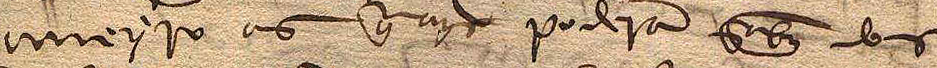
aueyro as q̄ays poderā sābr dos
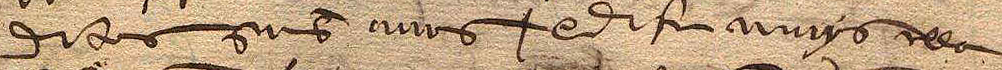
ditos seus amos / e dise mays ella
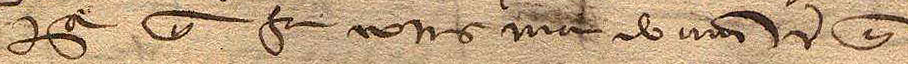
tsa q̄ ha coresma do an̄o ē q̄
